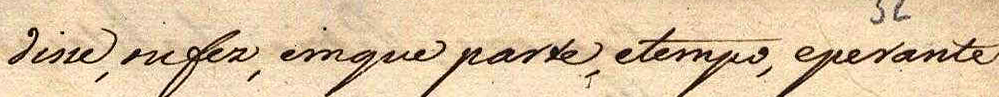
disse, ou fez, em que parte, e tempo, e perante
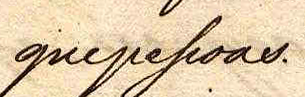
que pessoas.
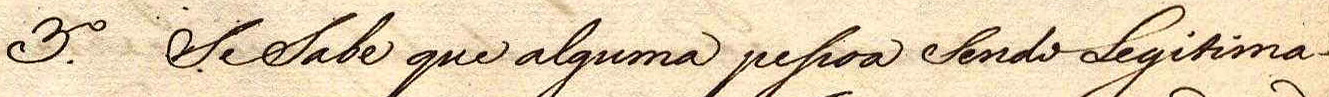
3.o Se Sabe que alguma pessoa Sendo Legitima
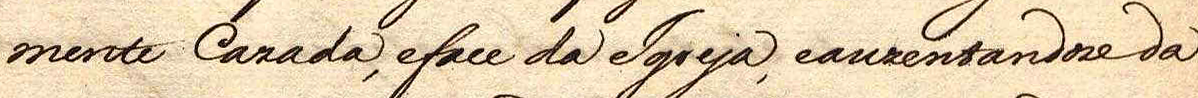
mente Cazada, e face da Igreja, e auzenandoze da
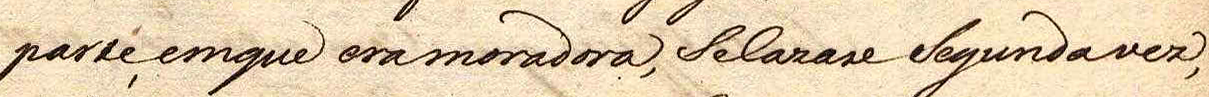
parte, em que era moradora, Se Cazase Segunda vez,
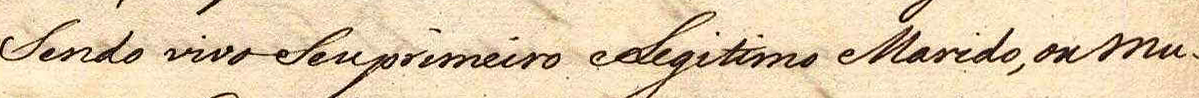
Sendo vivo Seu primeiro e Legitimo Marido, ou mu
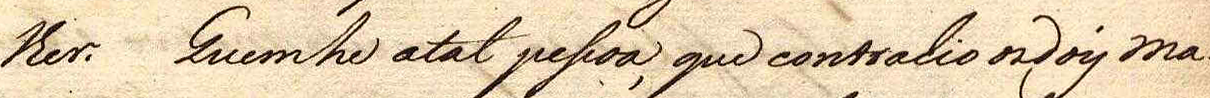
lher. Quem he a tal pessoa, que contrahio oz dois ma
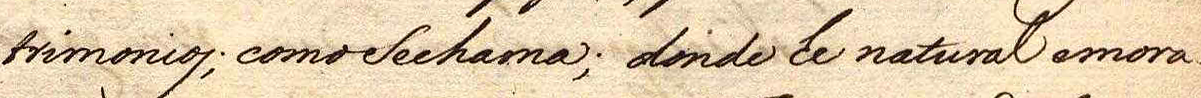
trimonios, como se chama, donde he natural e mora
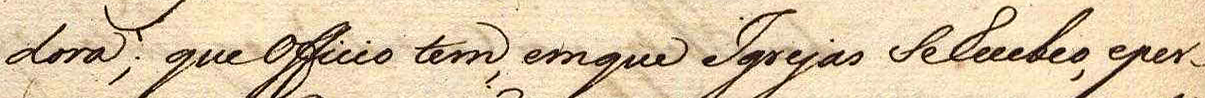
dora; que officio tem, em que Igrejas se Recebeo, e per
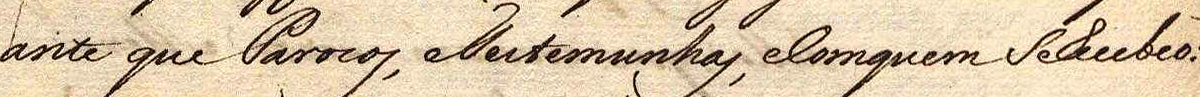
ante que Parocos, e Testemunhas, e Com quem Se Recebeo:
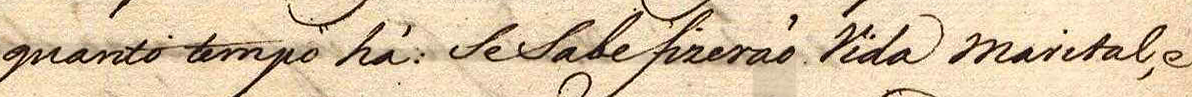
quanto tempo há. Se Sabe fizeraõ Vida marital, e
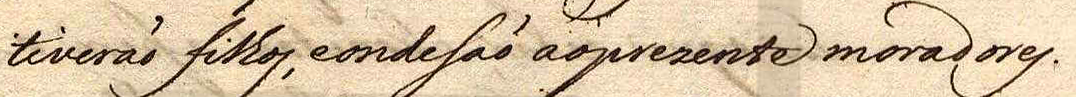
tiveraõ filhos, e onde saõ ao prezente moradores.
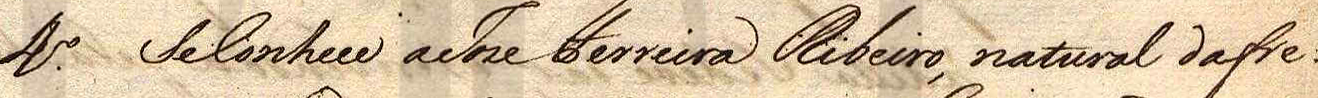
4.o Se Conhece a Ioze Ferreira Ribeiro, natural da fre
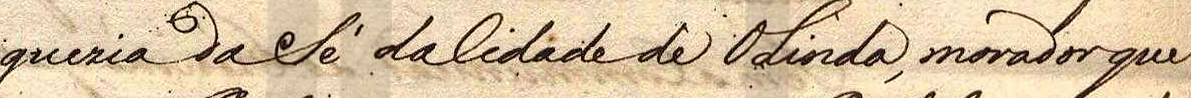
guezia da Sé da Cidade de Olinda, morador que
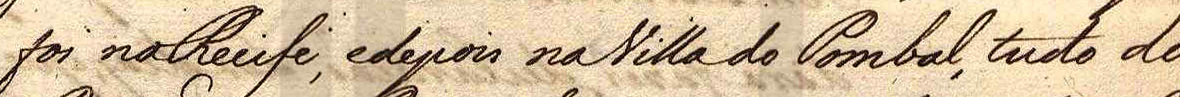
foi no Recife, e depois na Villa do Pombal, tudo do
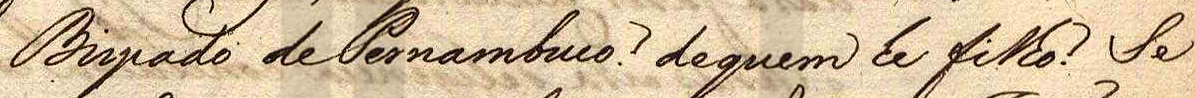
Bispado de Pernambuco? de quem he filho? Se
